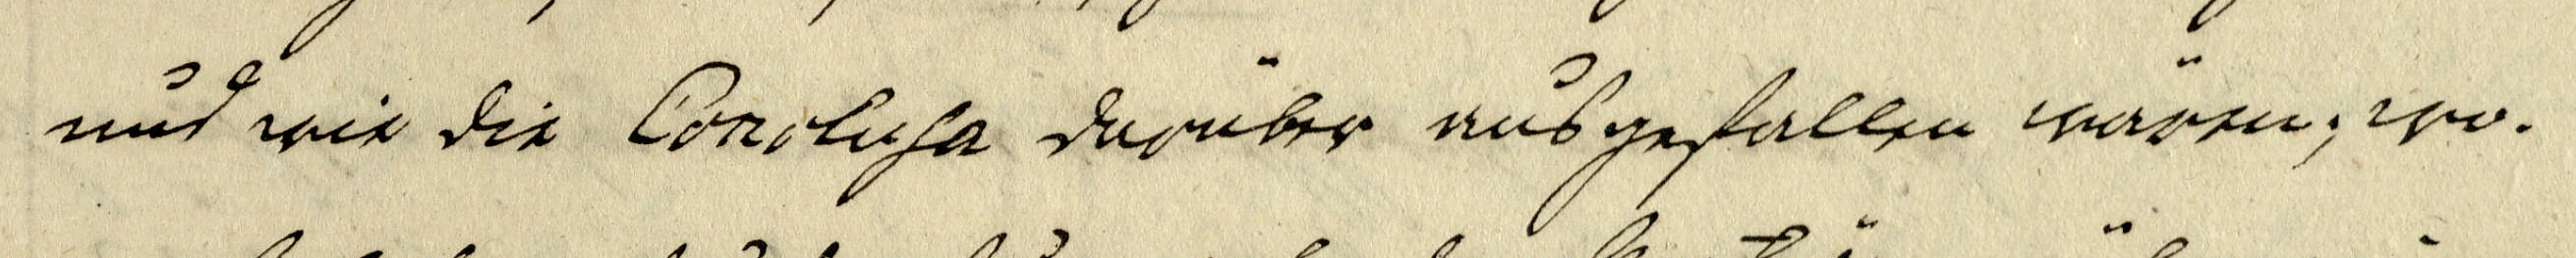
und wie die Conclusa darüber ausgefallen wären; wo¬
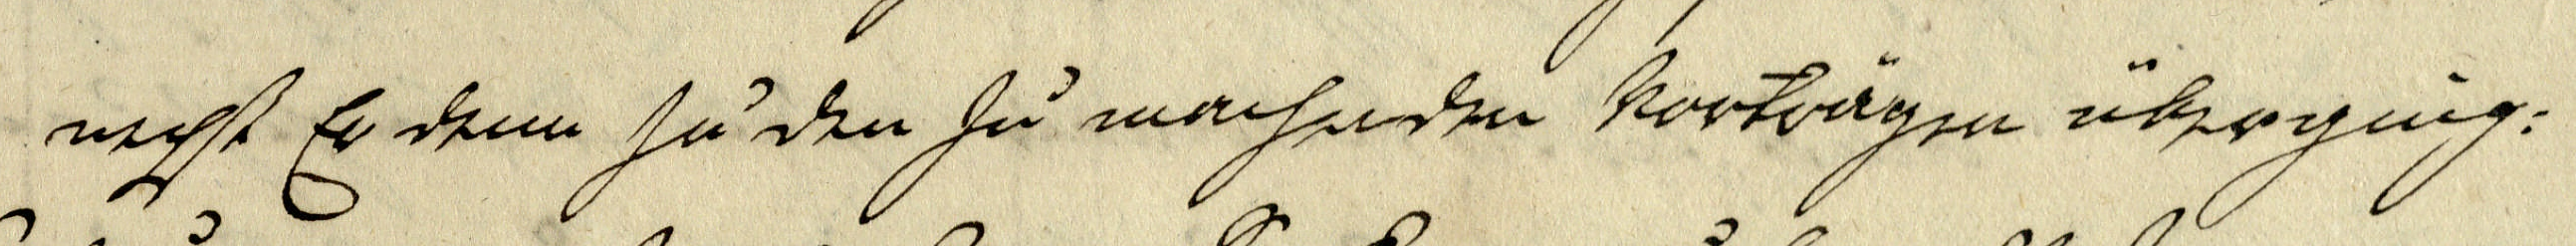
nechst Er denn zu den zu machenden Vorträgen überging:
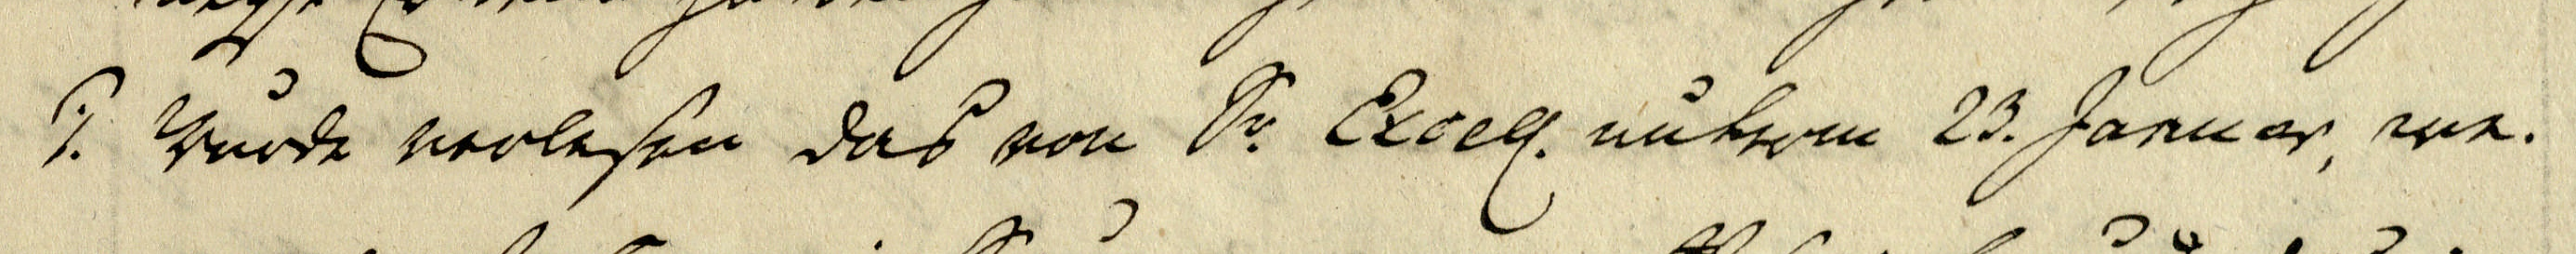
1. Wurde verlesen das von Sr Excell. unterm 23. Januar, we¬
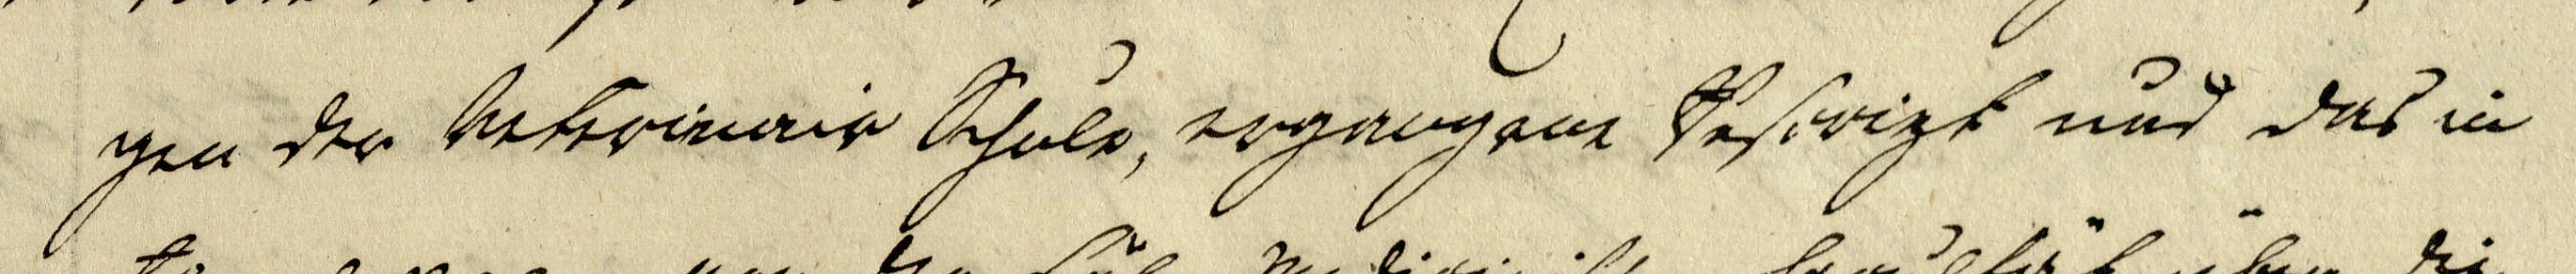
gen der Veterinair Schule, ergangene Rescript und das in
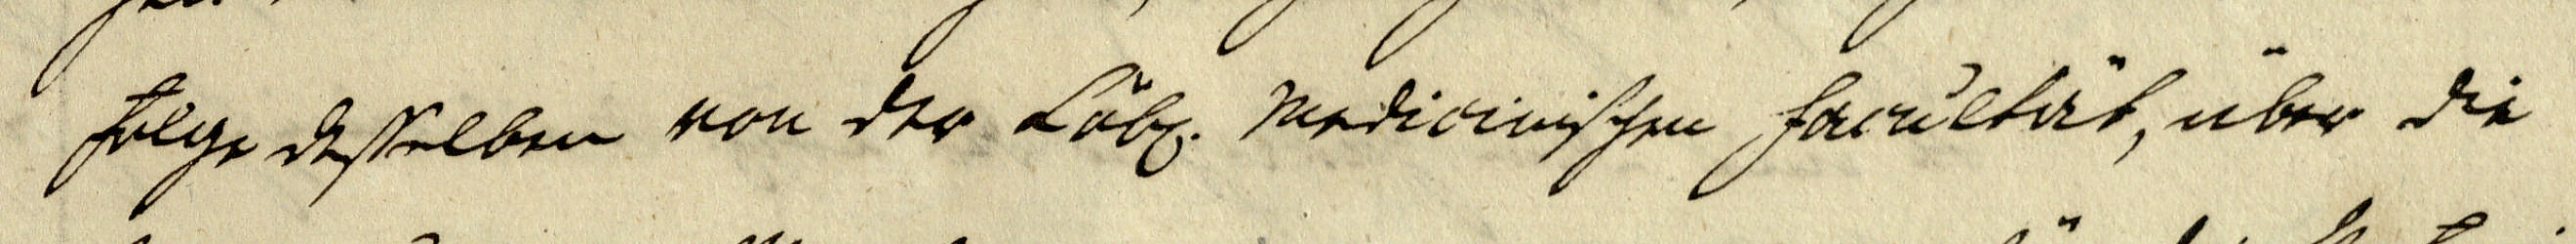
Folge desselben von der Löbl. Medicinischen Facultät, über die
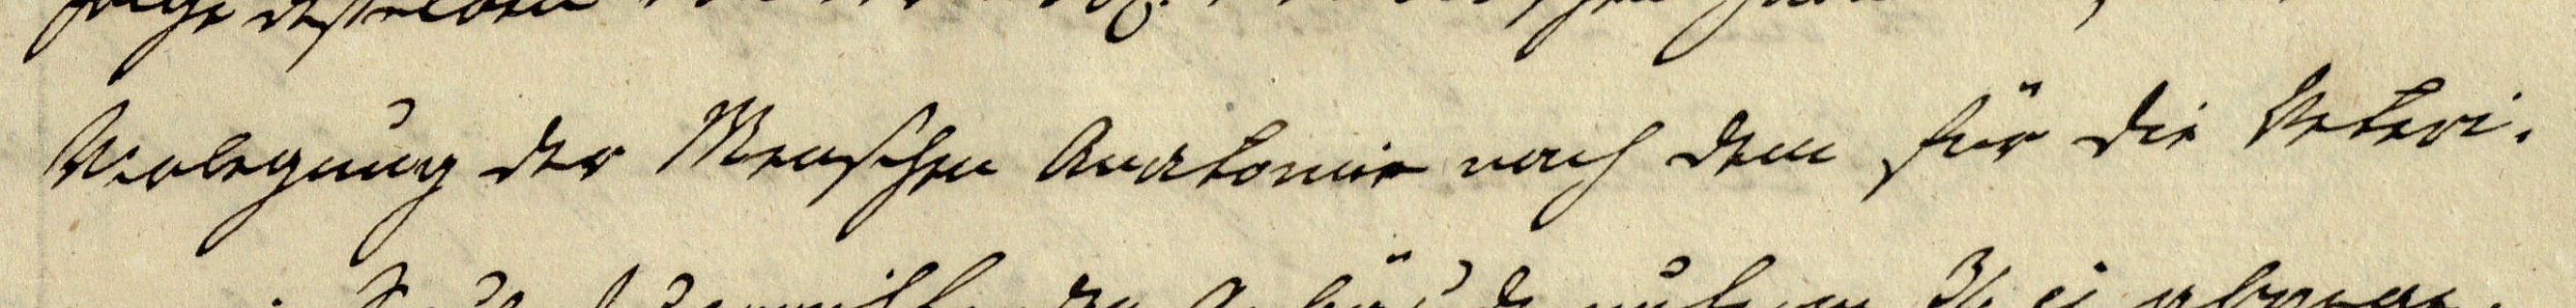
Verlegung der Menschen Anatomie nach dem für die Veteri¬
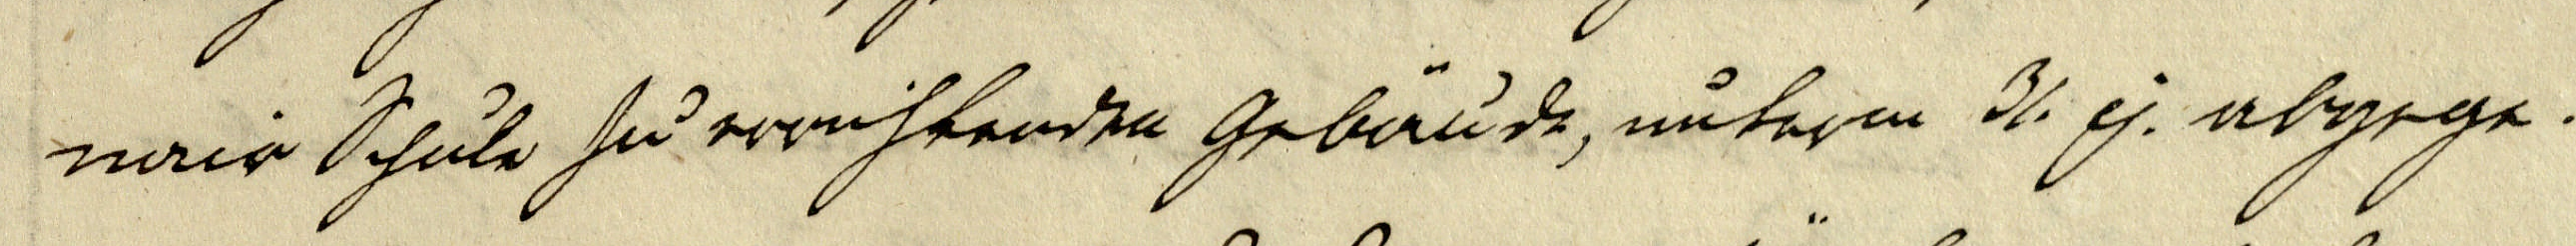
nair Schule zu errichtenden Gebäude, unterm 21. ej. abgege¬
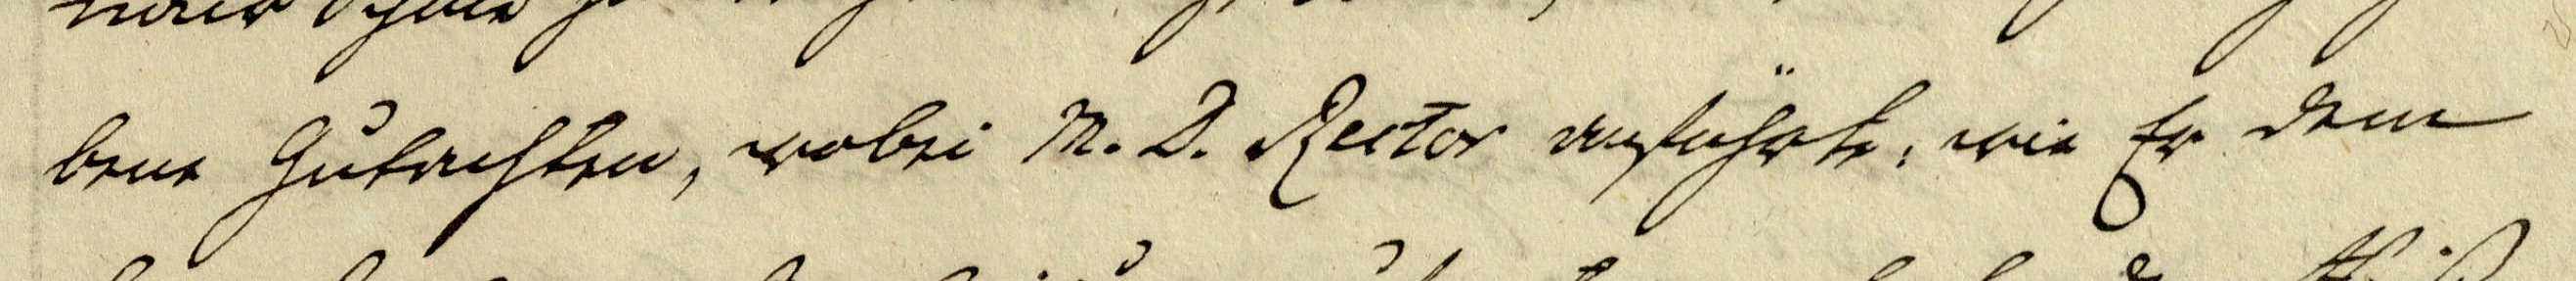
bene Gutachten, wobei M. D. Rector anführte, wie Er dem
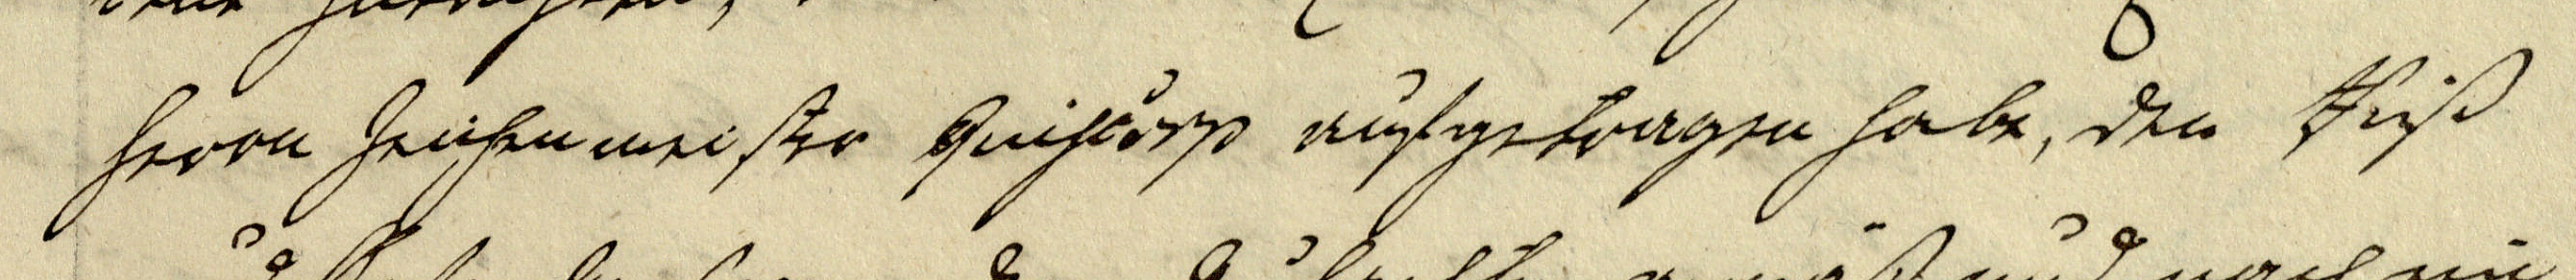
Herrn Zeichenmeister Quistorp aufgetragen habe, den Riß
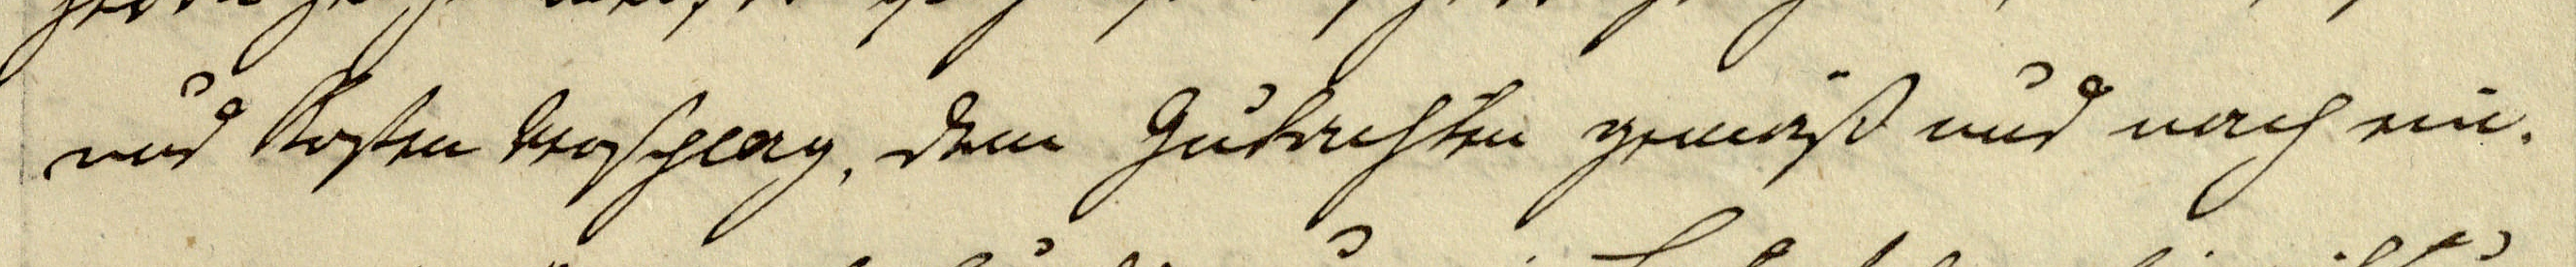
und Kosten Verschlag, dem Gutachten gemäß und nach ein¬
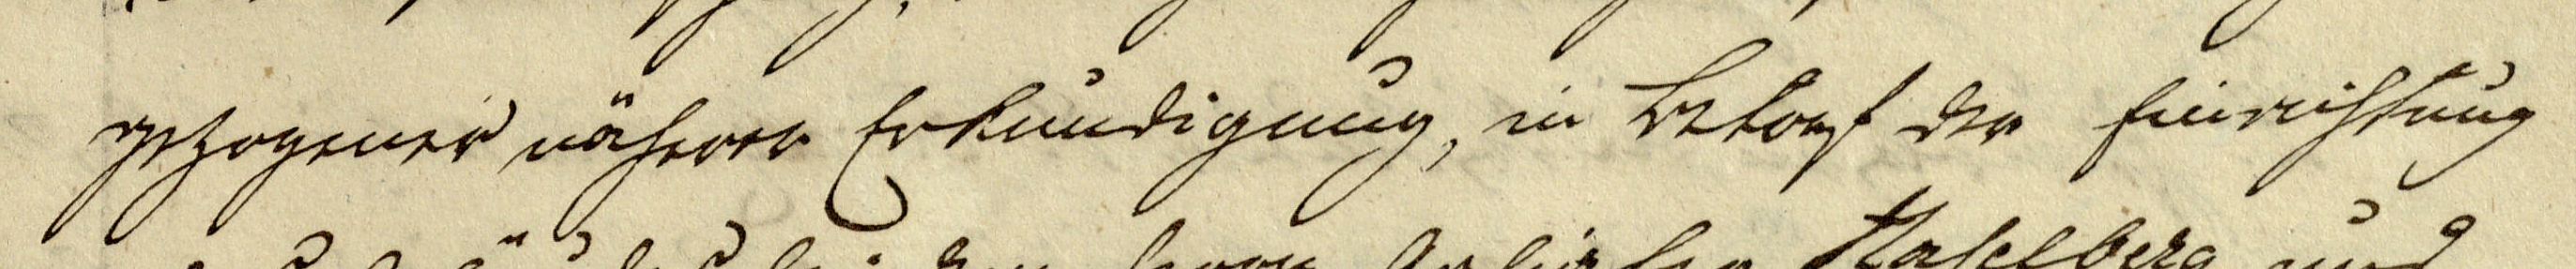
gezogener näherer Erkundigung, in Betref der Einrichtung
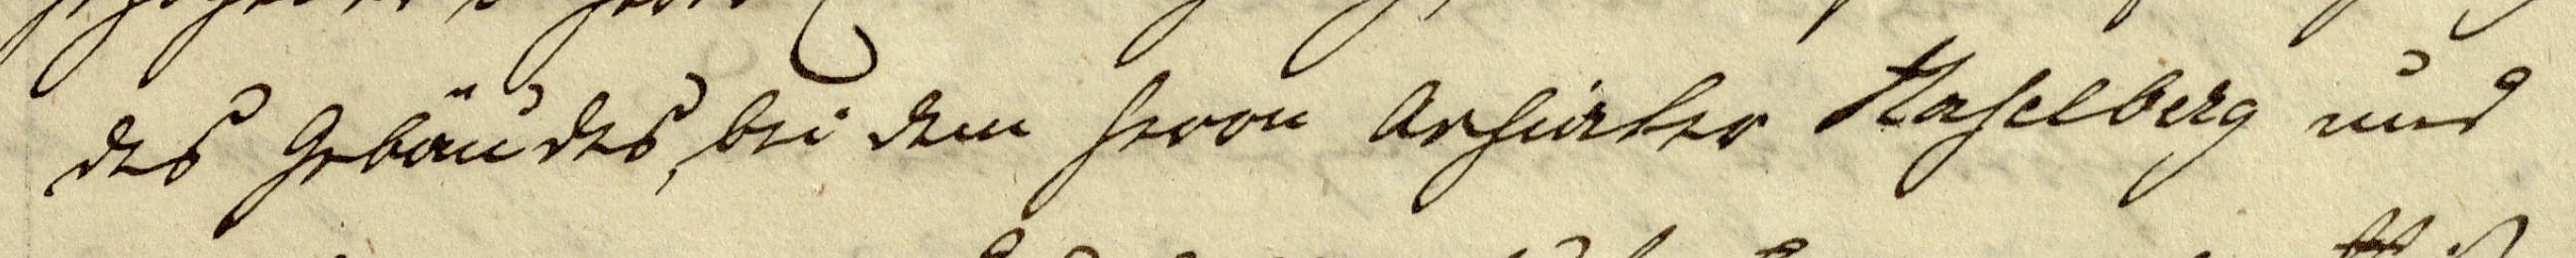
des Gebäudes bei dem Herrn Archiater Haselberg und
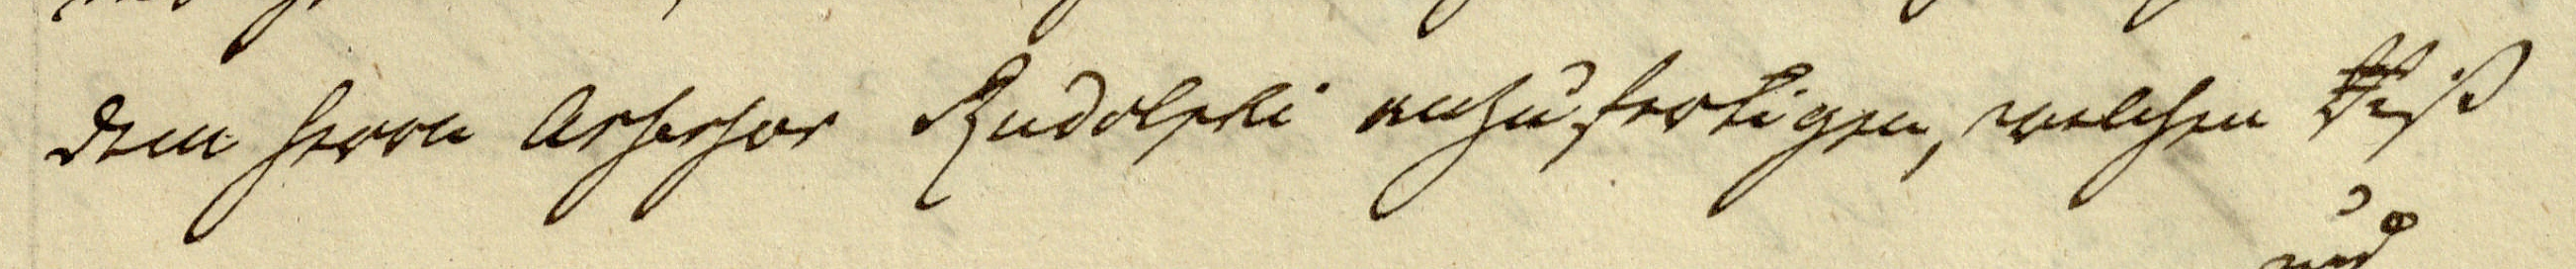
dem Herrn Assessor Rudolphi anzufertigen, welchen Riß
